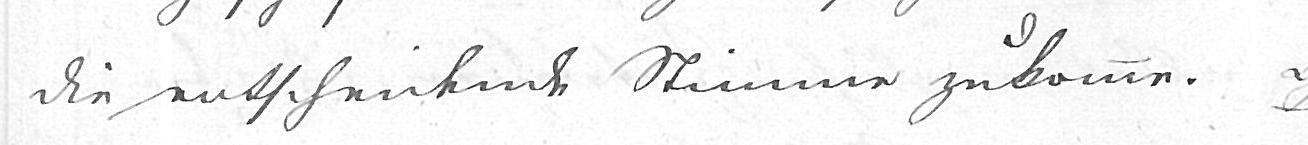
die entscheidende Stimme zukomme.
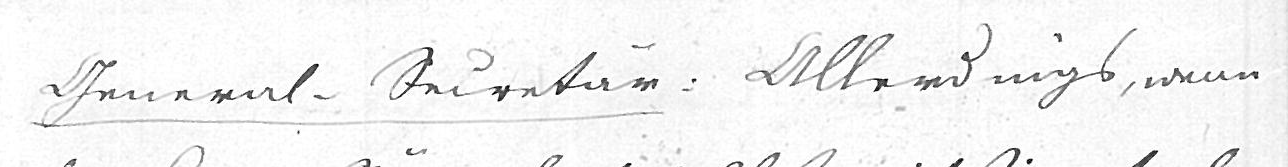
General-Secretär: Allerdings, wenn
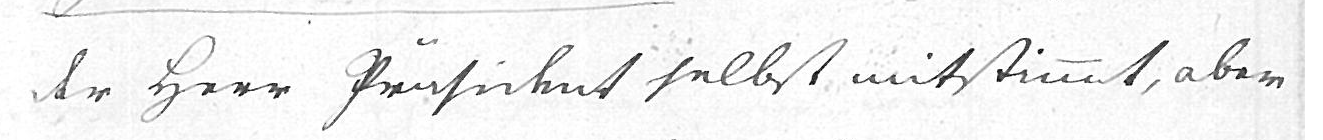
der Herr Präsident selbst mitstimmt, aber
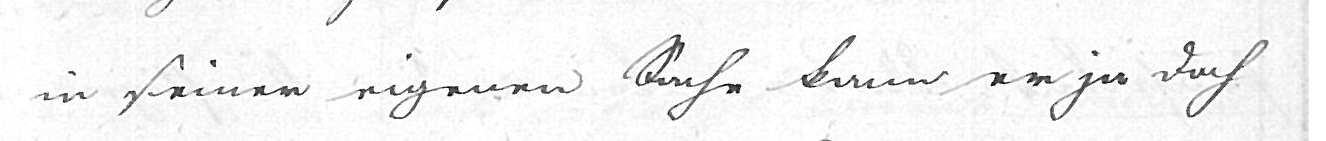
in seiner eigenen Sache kann er ja doch
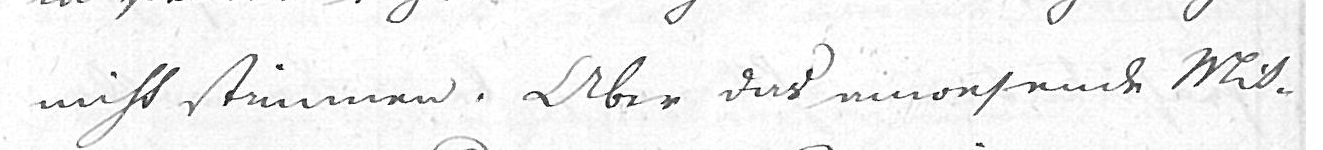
nicht stimmen. Aber das anwesende Mit-
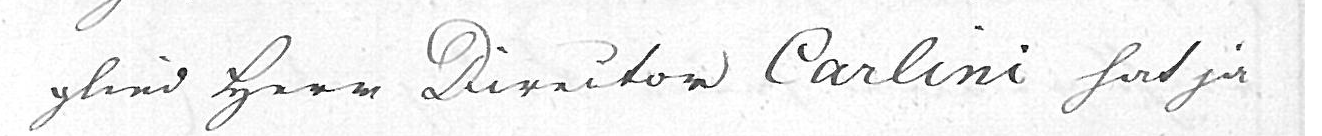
glied Herr Director Carlini hat ja
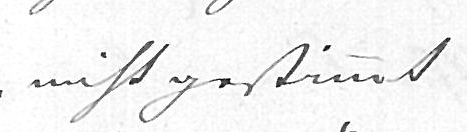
nicht mitgestimmt.
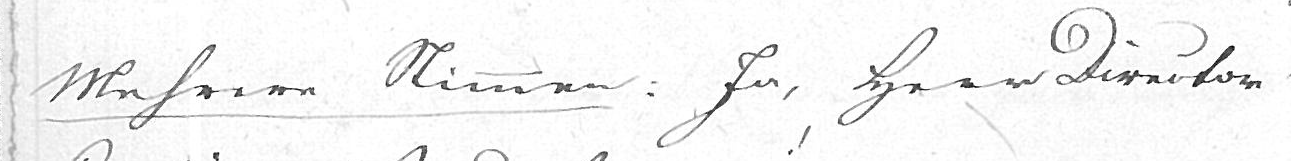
Mehrere Stimmen: Ja, Herr Director
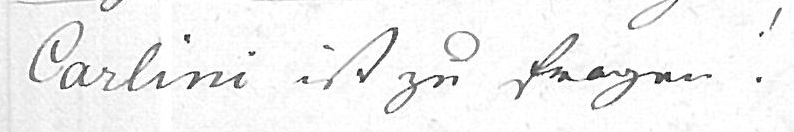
Carlini ist zu fragen.
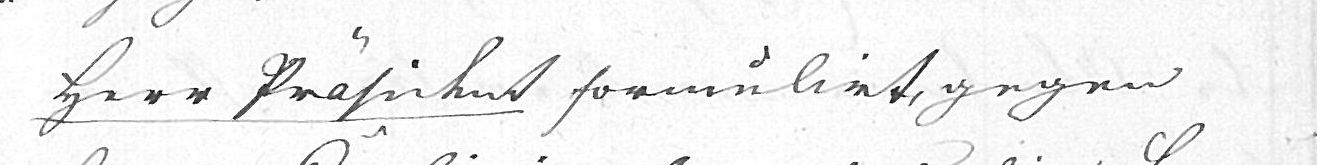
Herr Präsident formulirt, gegen
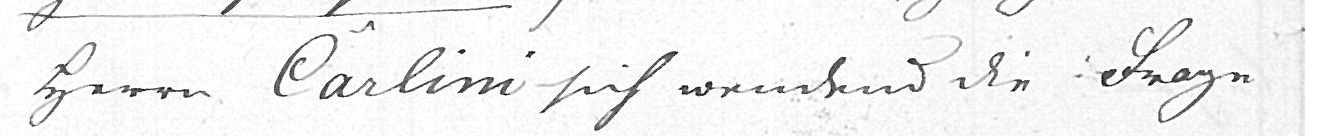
Herrn Carlini sich wendend die Frage
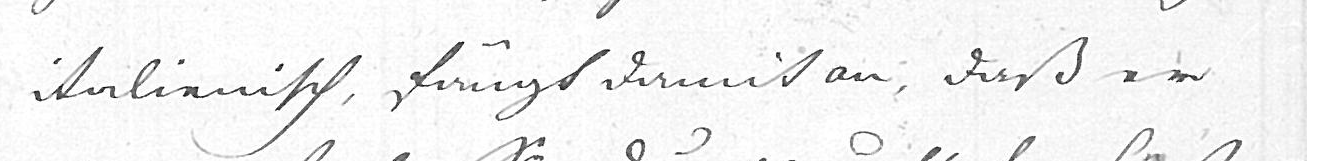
italienisch, fängt damit an, daß er
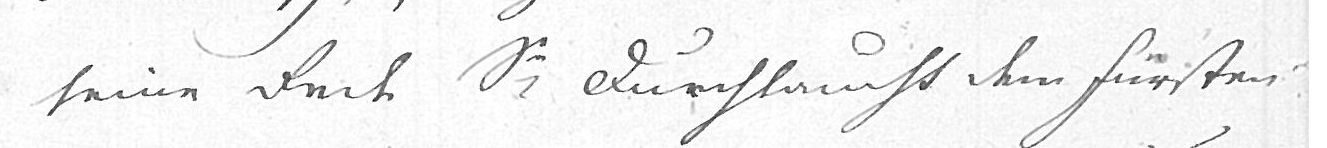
seine Rede Sr. Duchlaucht dem Fürsten
